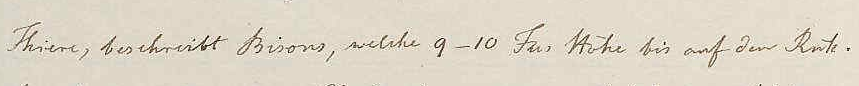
Thiere, beschreibt Bisons, welche 9–10 Fus Höhe bis auf den Rük-
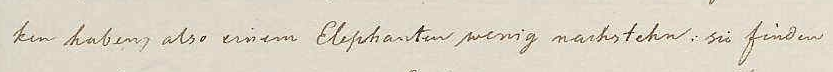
ken haben, also einem Elephanten wenig nachstehn: sie finden
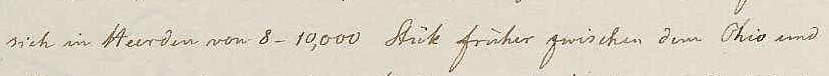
sich in Heerden von 8–10,000 Stük früher zwischen dem Ohio und
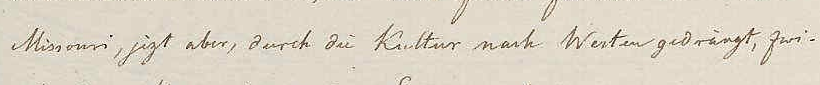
Missouri, jezt aber, durch die Kultur nach Westen gedrängt, zwi-
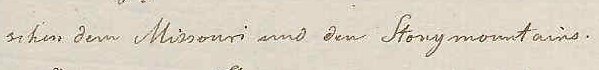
schen dem Missouri und den Stonymountains.
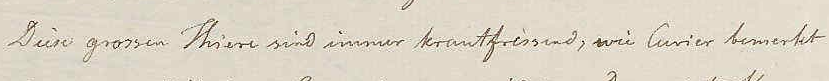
Diese grossen Thiere sind immer krautfressend, wie Cuvier bemerkt
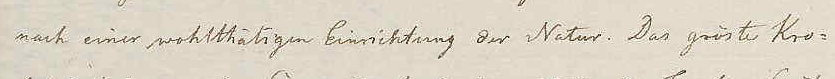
nach einer wohlthätigen Einrichtung der Natur. Das gröste Kro-
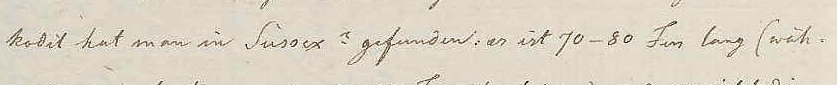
kodil hat man in Sussex ? gefunden: es ist 70–80 Fus lang und erreicht
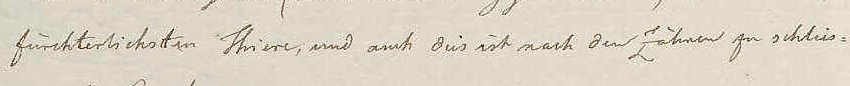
fürchterlichsten Thiere, und auch dies ist nach den Zähnen zu schlies-
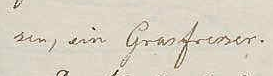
sen, ein Grasfresser.
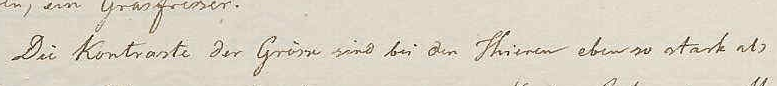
Die Kontraste der Grösse sind bei den Thieren eben so stark als
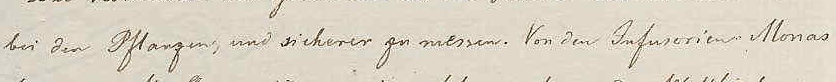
bei den Pflanzen, und sicherer zu messen. Von den Infusorien Monas
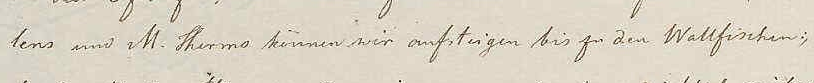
lens und M. Thermo können wir aufsteigen bis zu den Wallfischen;
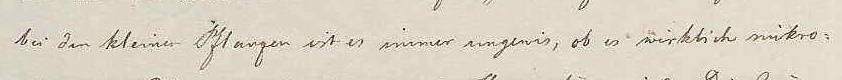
bei den kleiner Pflanzen ist es immer ungewis, ob es wirklich mikro-
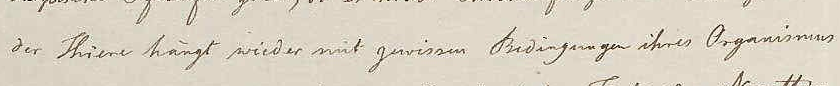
der Thiere hängt wieder mit gewissen Bedingungen ihres Organismus
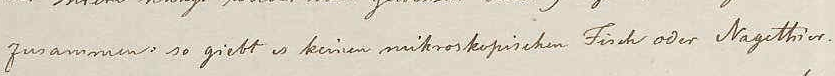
zusammen: so giebt es keinen mikroskopischen Fisch oder Nagetthier
